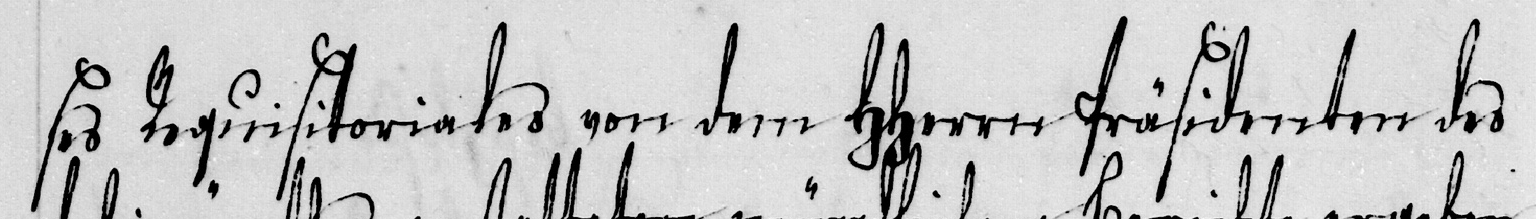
ses Requisitoriales von dem HHerrn Präsidenten des
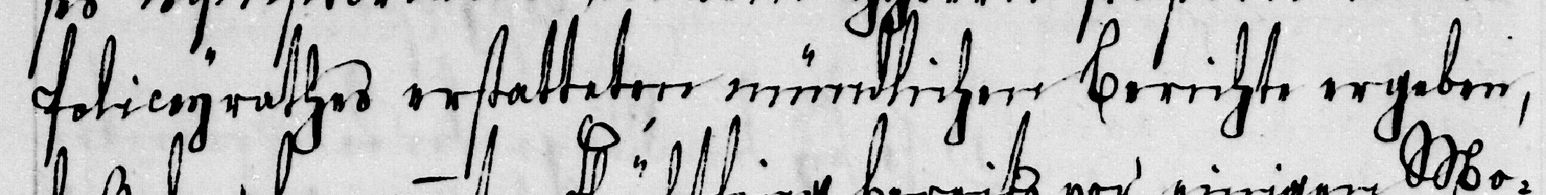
Policeyrathes erstatteten mündlichen Berichte ergeben,
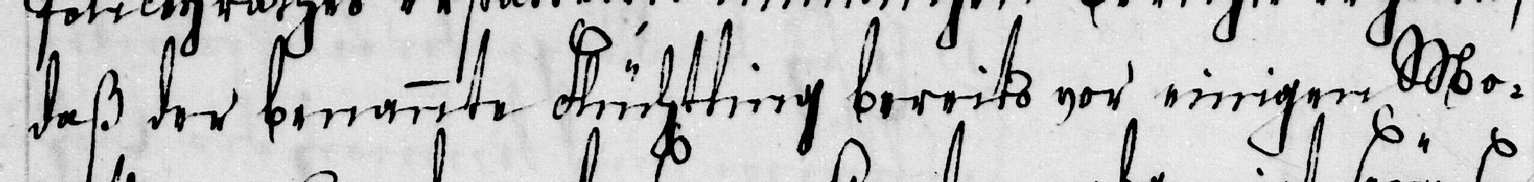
daß der benannte Flüchtling bereits vor einigen Mo¬
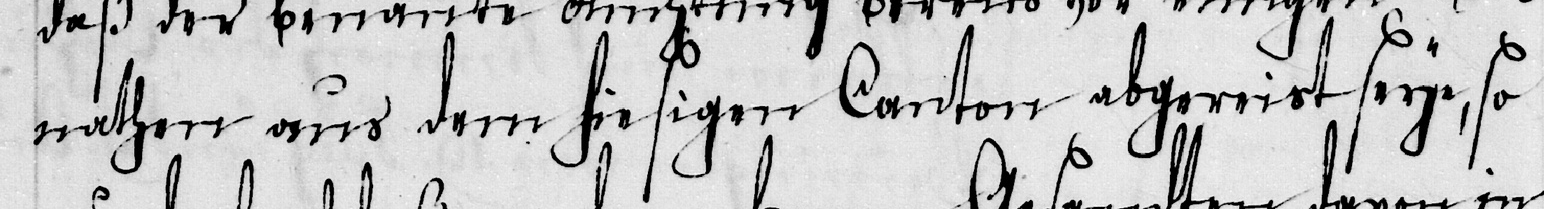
nathen aus dem hiesigen Canton abgereist seye, so
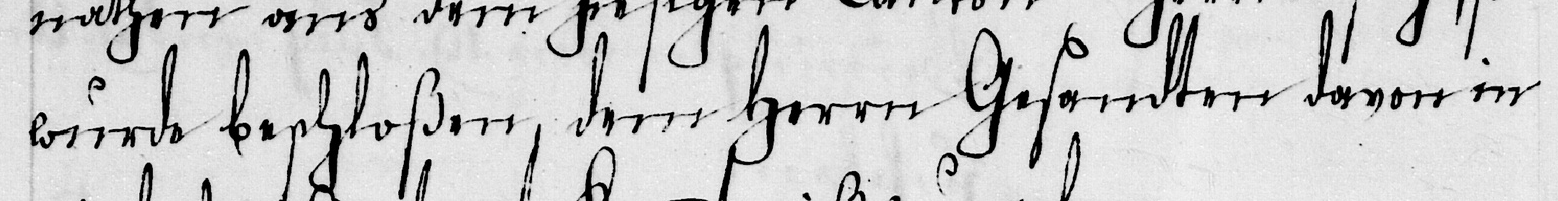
wurde beschloßen, dem Herrn Gesandten davon in
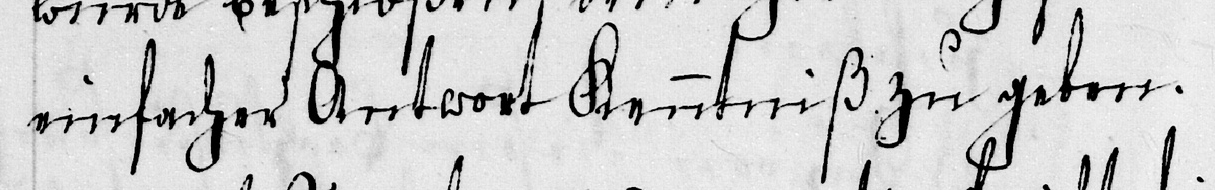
einfacher Antwort Kenntniß zu geben.
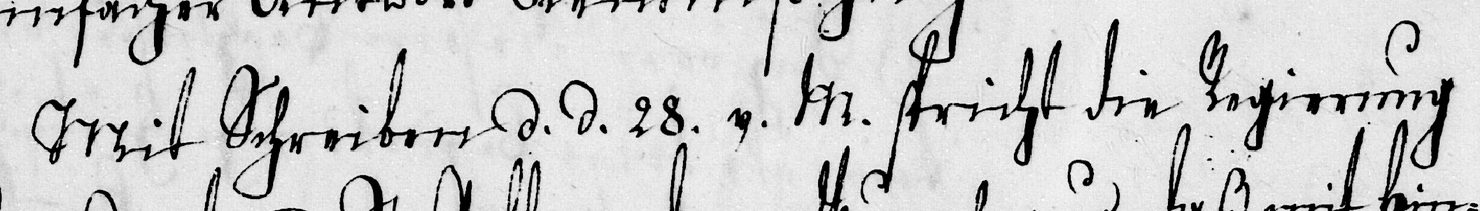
Mit Schreiben d. d. 28. v. M. spricht die Regierung
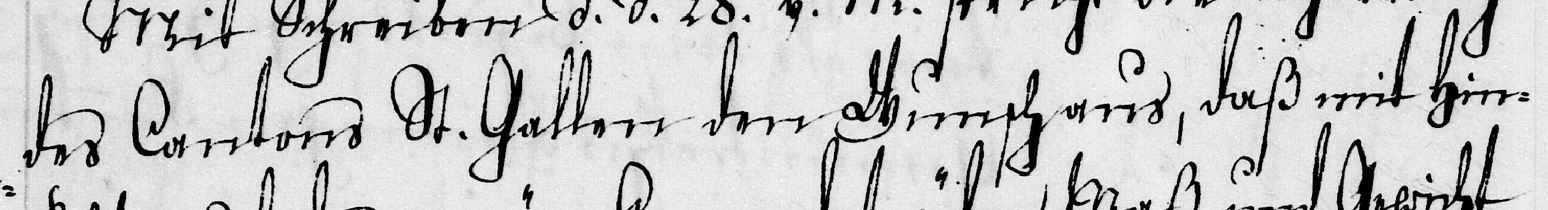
des Cantons St. Gallen den Wunsch aus, daß mit Hin¬
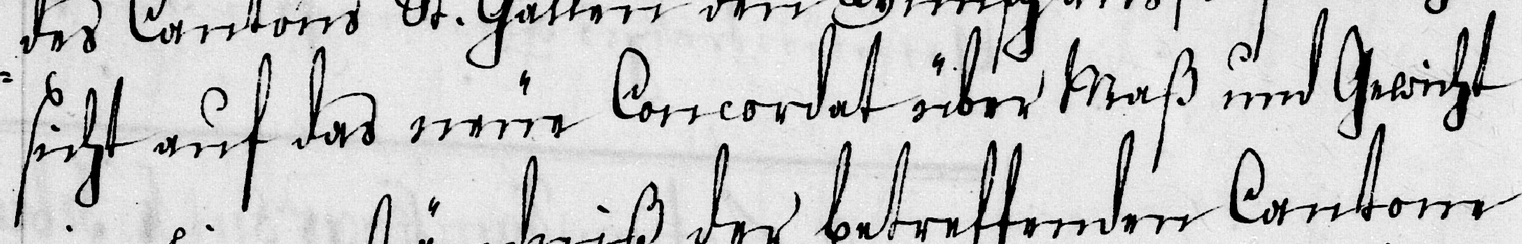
sicht auf das neue Concordat über Maß und Gewicht
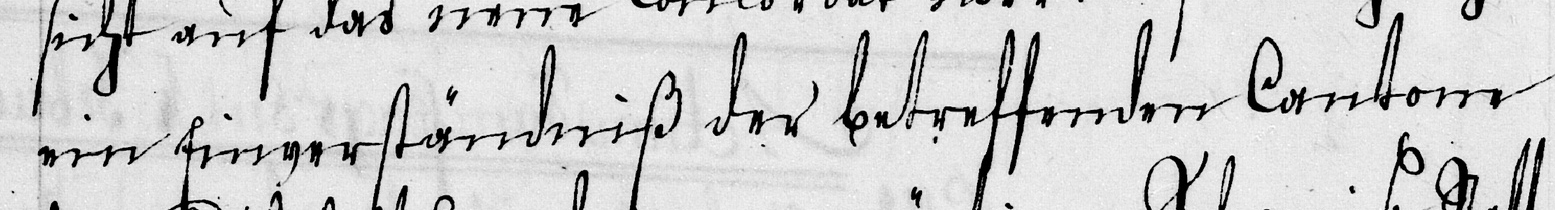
ein Einverständniß der betreffenden Cantone
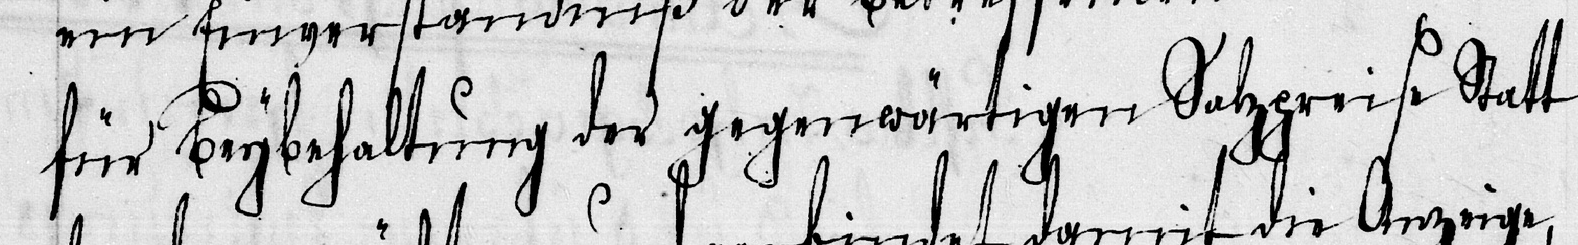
für Beybehaltung der gegenwärtigen Salzpreise Statt
